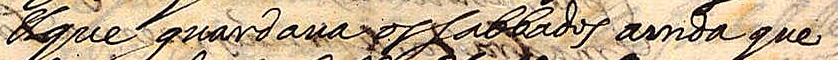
& que guardaua os sabbados ainda que
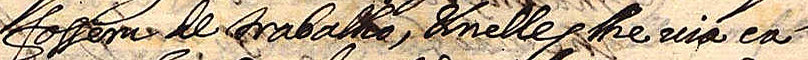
fossem de trabalho, & nelles lhe uia ca
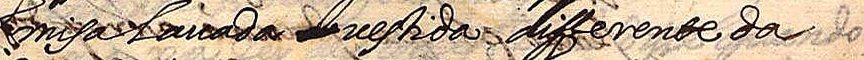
misa lauada duestida differente da
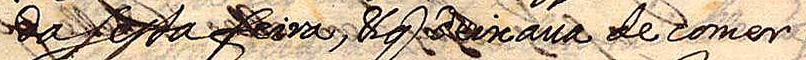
da sesta feira, & q̄ deixaua de comer
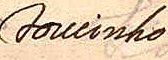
toucinho
